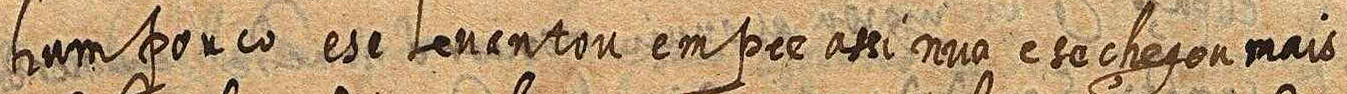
hum pouco e se Leuantou em pee assi nua e se chegou mais
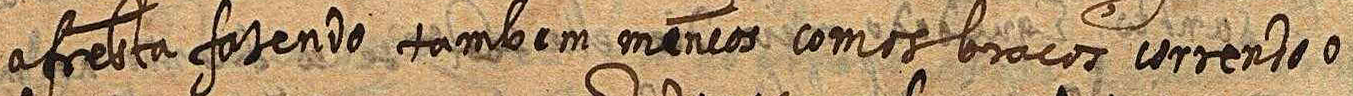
a fresta fazendo também meneos com os bracos correndo o
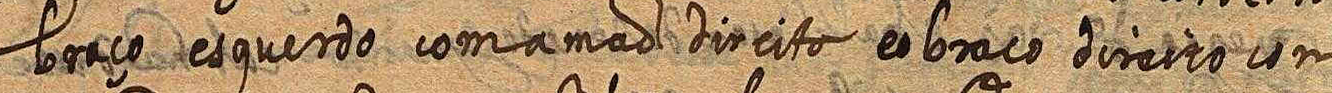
braço esquerdo com a maõ direita e o braco direito com
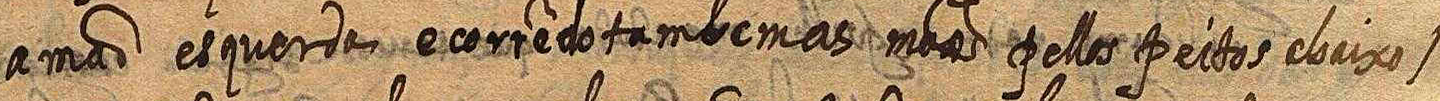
a maõ esquerda e corrēdo tambem as mãos pellos peitos abaixo /
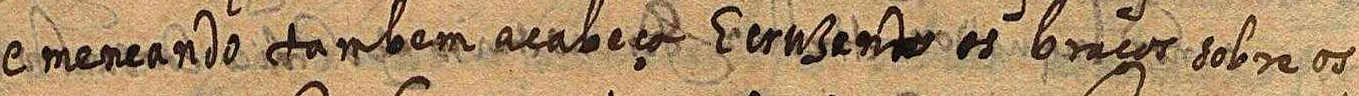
e meneando tambem a cabeça E cruzando os braços sobre os
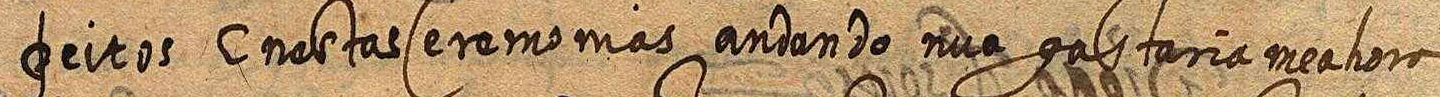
peitos E nestas Ceremonias andando nua gastaria mea hora
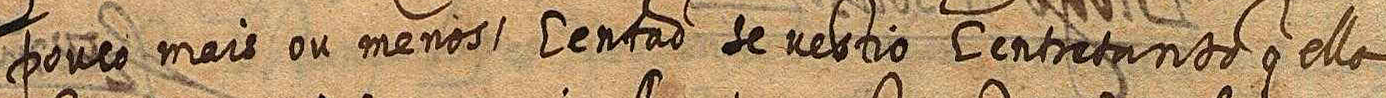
pouco mais ou menos / E então se uestio e entretanto q̄ ella
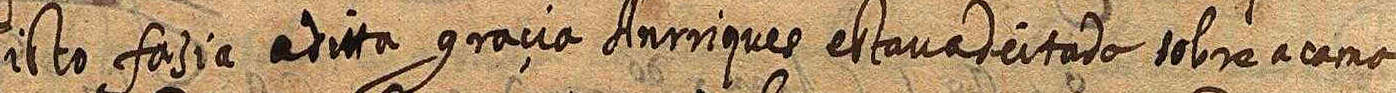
isto fazia a ditta graçia Anrriques estaua deitada sobre a cama
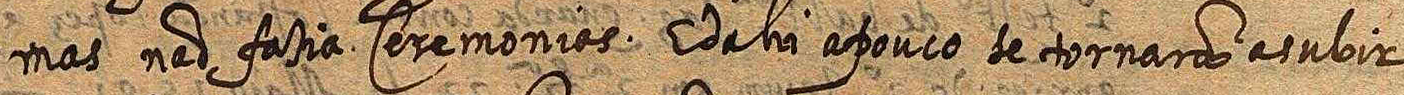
mas não fazia Ceremonias. E dahi a pouco se tornarão a subir
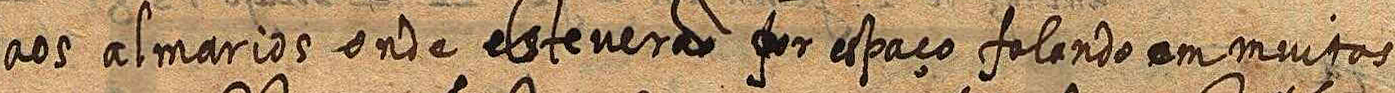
aos almarios onde esteuerão por espaço falando em muitas
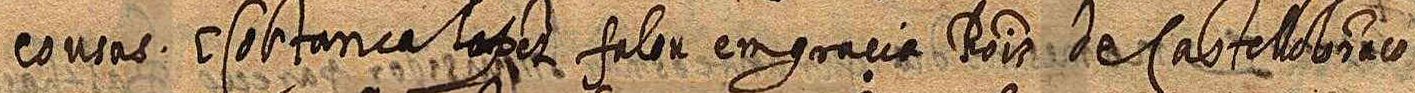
cousas. E Costanca lopez̄ falou em graçia Roīz de Castello brāco
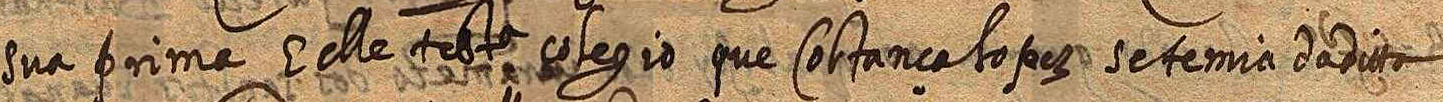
sua prima E elle testa colegio que Costança lopez se remia da ditta
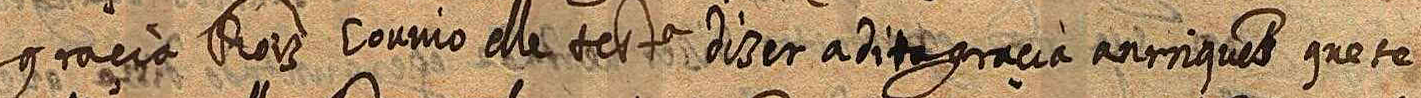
graçia Rōiz E ouuio elle testa dizer a dita graçia anrriquēz que se
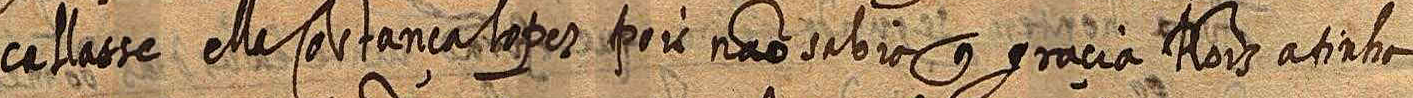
callasse ella Costança lopez pois não sabia q̄ graçia Rōiz a tinha
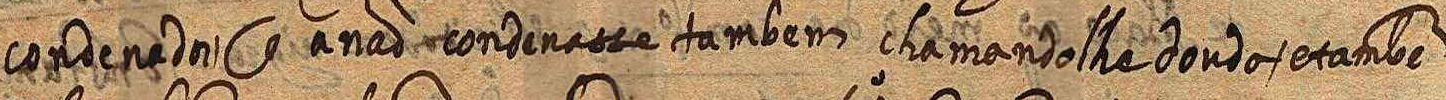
condenado q̄ a não condenasse tambem chamandolhe douda / e tambē
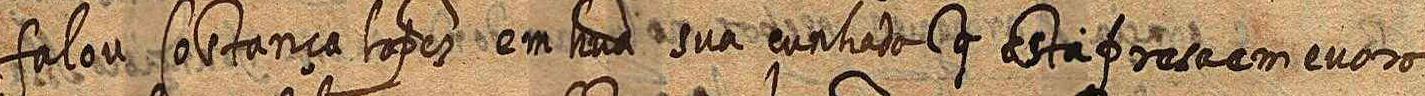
falou Costança lop̄ez em huā sua cunhada q̄ esta presa em euora
